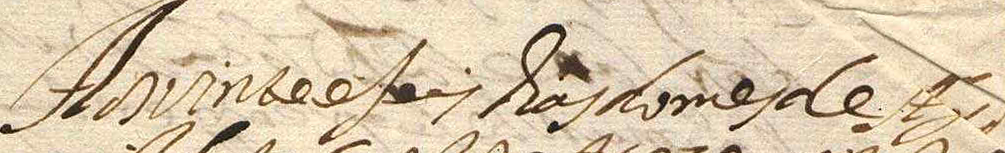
Aos vinte e seis dias do mes de A
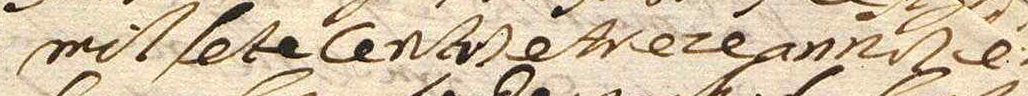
mil setecentos e treze annos e
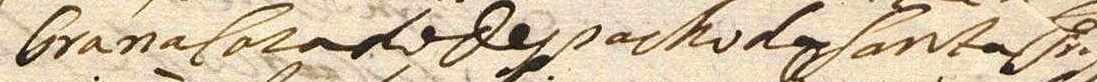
bra na Caza do despacho da santa Jn
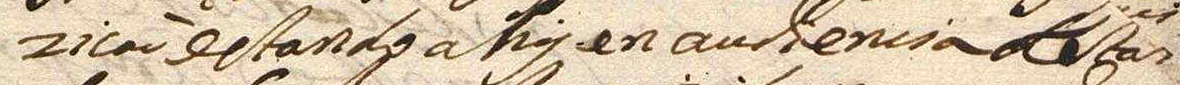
ziçaõ estando ahy en audiencia de tar
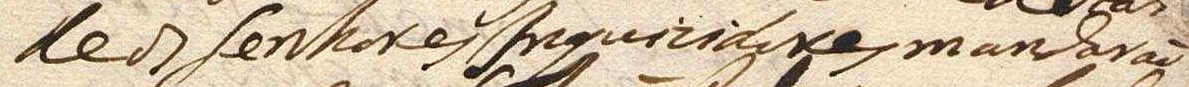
de os senhores Jnquizidores mandaraõ
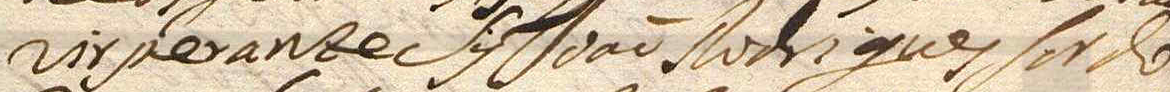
vir perante Sy Joaõ Rodrigues sordo
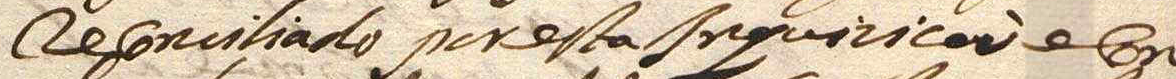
Reconciliado por esta Jnquiziçaõ e Con
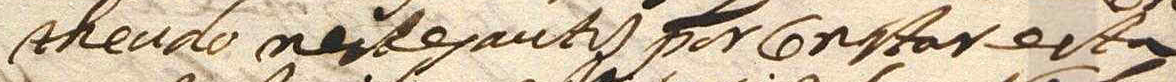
theudo nestes autos por constar esta
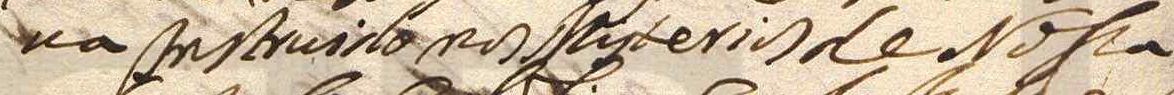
ua Jnstruido nos Misterios de Nossa
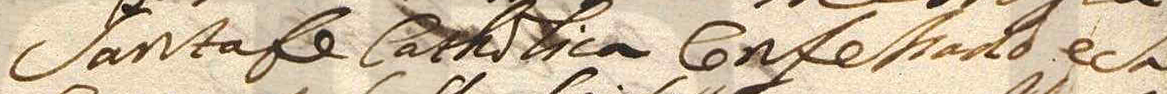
Santa fe Catholica Confessado, e Sa
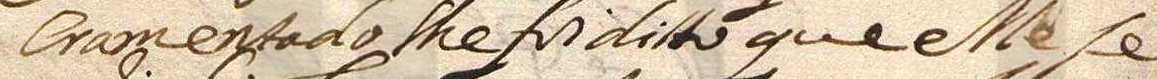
cramentado lhe foi ditto que elle se
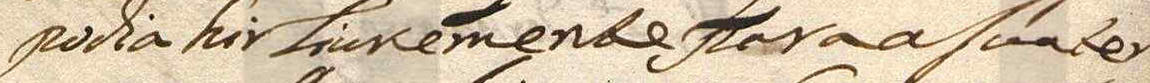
podia hir Liuremente para a sua ter
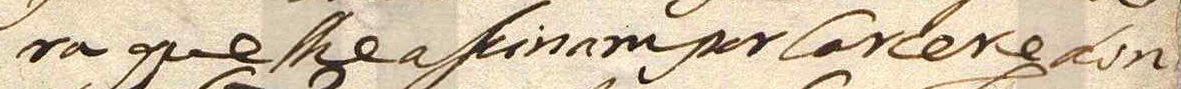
ra que lhe assinam por Carcere don
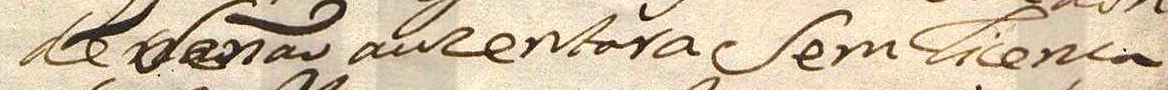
de Se naõ auzentara Sem licença
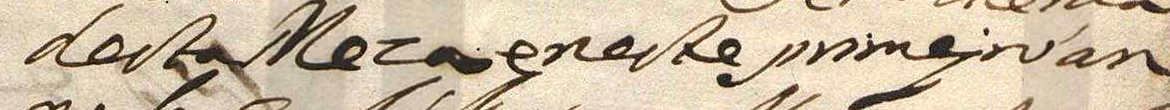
desta Meza, e neste primejro an
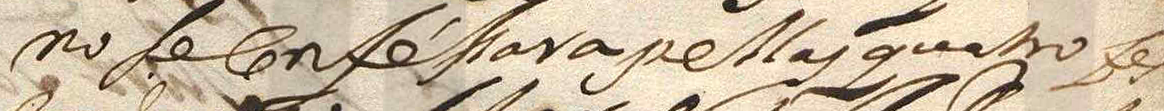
no se confessara pellas quatro fes
